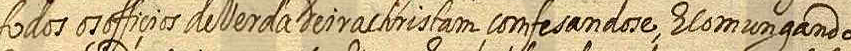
todos os officios de verdadeira christam, confesandose, E comungando
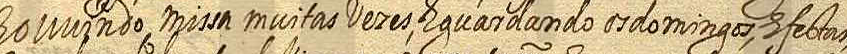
E ouuindo missa muitas vezes, E guardando os domingos, E festas
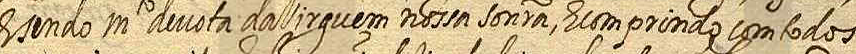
E sendo mto deuota da Virguem nossa sonr̄a, E comprindo com todos
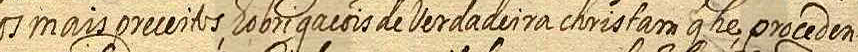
os mais preceitos, E obrigaçõis de verdadeira christam q̄ he, proceden
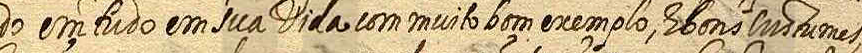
do em tudo em sua Vida com muito bom exemplo, E bons custumes,
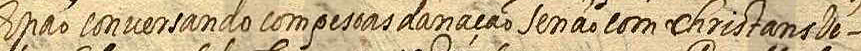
E não conuersando com pesoas da naçaõ senão com christans Ve
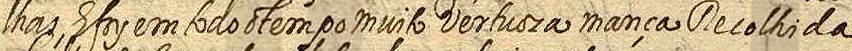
lhas, E foy em todo o tempo muito Vertuoza mança Recolhida
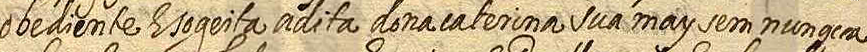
obediente E sogeita a dita dona caterina sua may sem nunqua
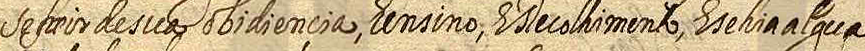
se sair de sua obidiencia, E ensino, E Recolhimento, E se hia algua
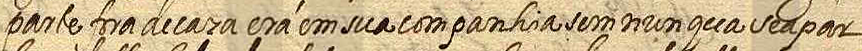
parte fora de caza era em sua companhia sem nunqua se apar
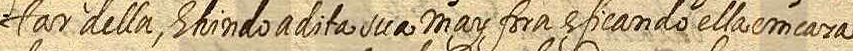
tar della, E hindo a dita sua may fora E ficando ella em caza
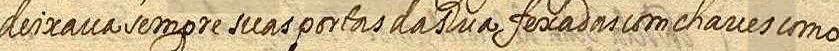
deixaua sempre suas portas da Rua fexadas com chaues como
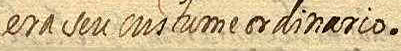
era seu custume ordinario.
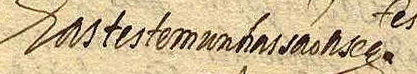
E as testemunhas são as seg.tes
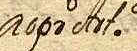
ao pro Art.o
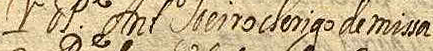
item o P.e Anto Soeiro clerigo de missa
